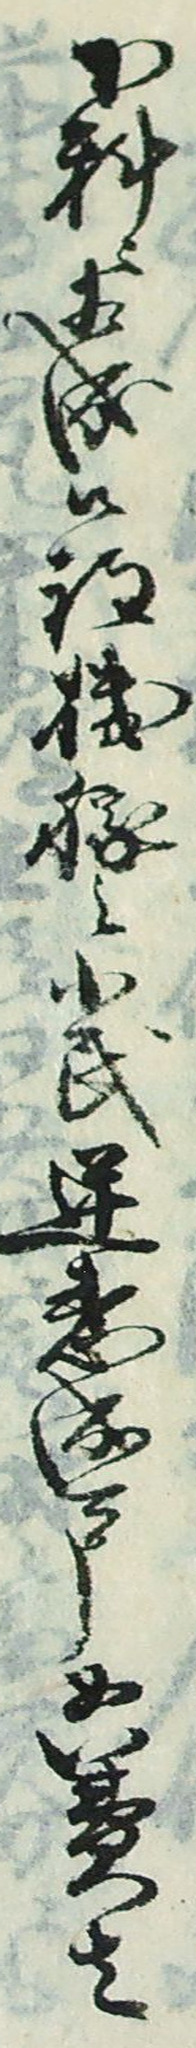下料に相成候程機稼之小民迷惑成申右費者
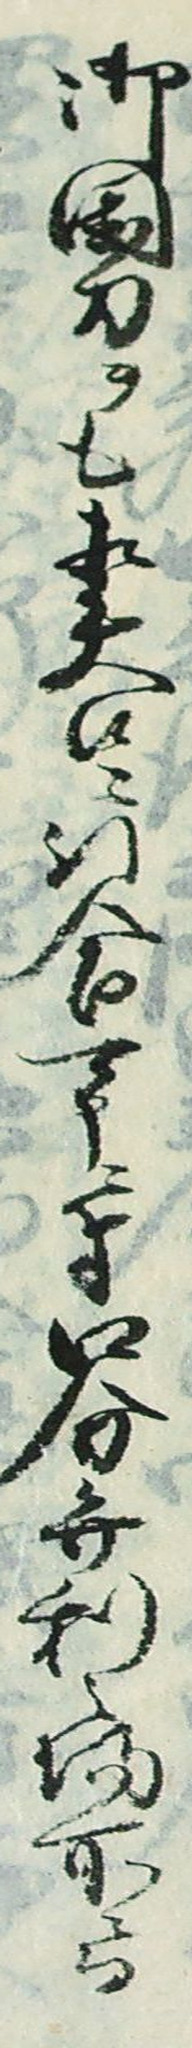御国力をも相失候に引合可申に付郷分弁利之場所に而
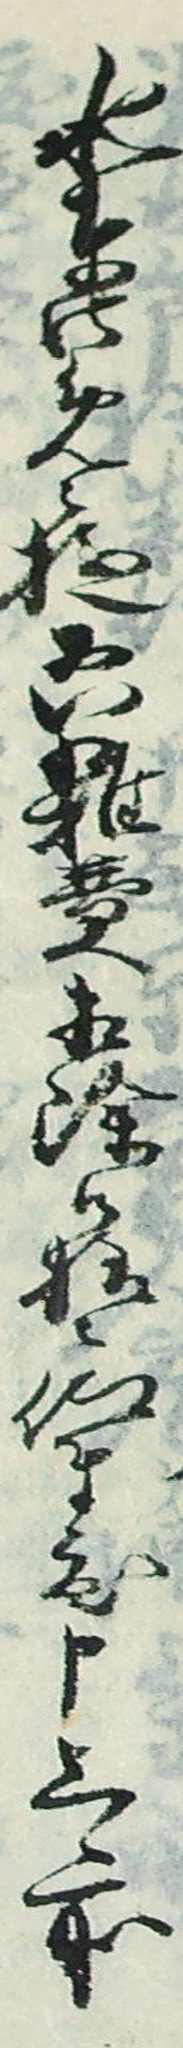水車御免被遊右雑費相除候様被仰付度申上候所
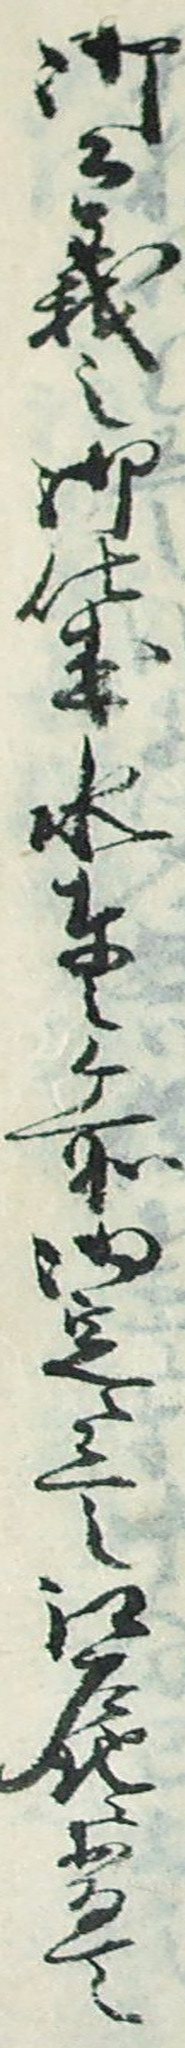御公義之御仕成水車之ケ所御定に有之江戸地におゐて

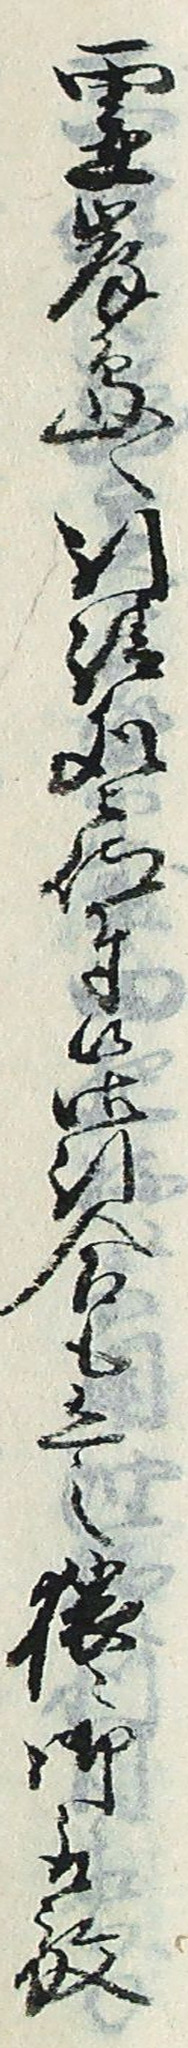霊岸島へ引請処被仰付候御引合も有之猥に御取放
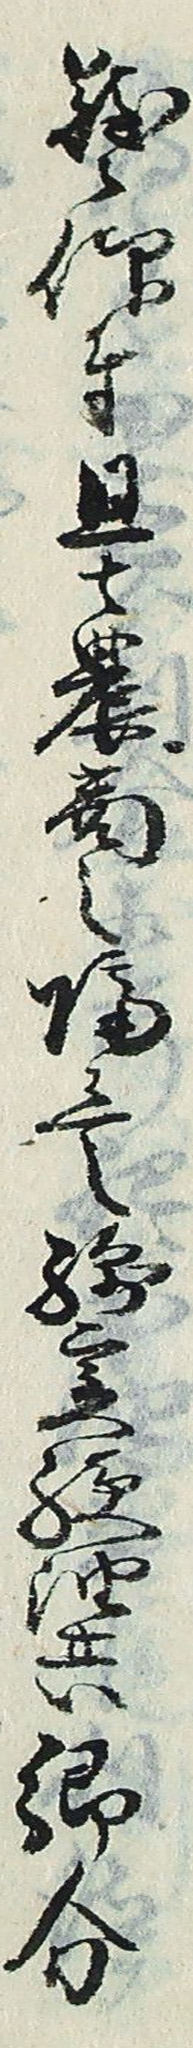難被仰付且者農商人之隔有之綿実絞油共郷分
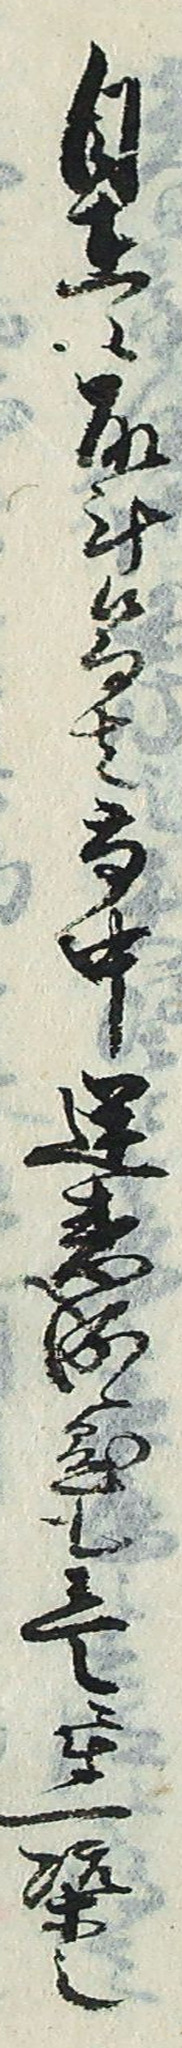自在に取計候而は市中迷惑成候懸も有之に付一概之
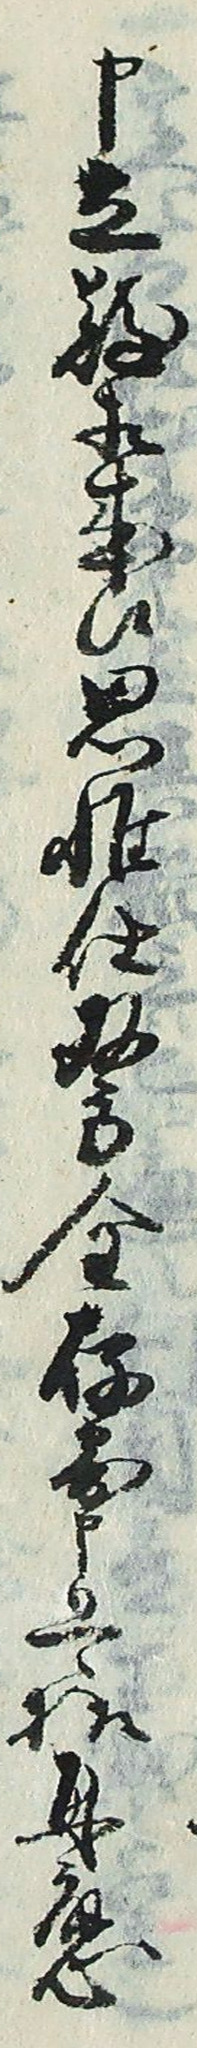申立難相成候思惟仕双方全存寄申上候様再応
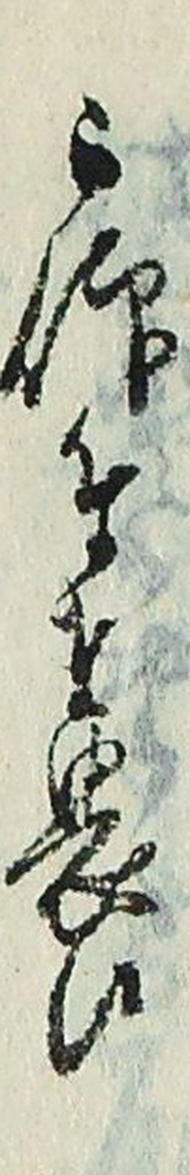被仰付奉畏候
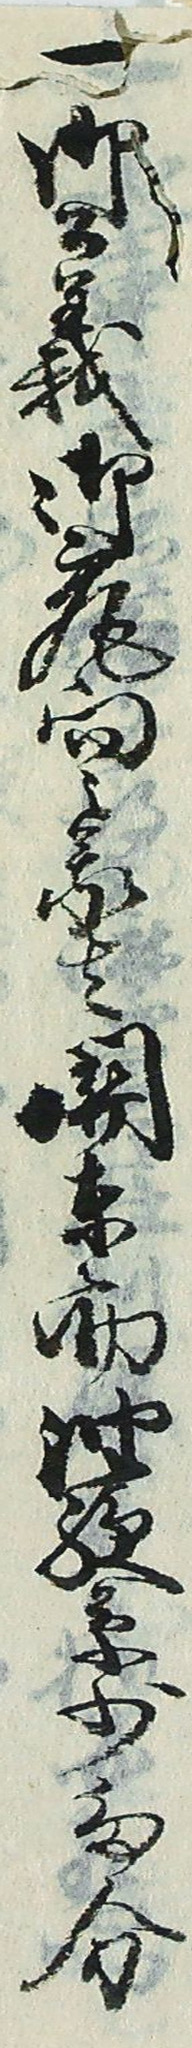一御公義御究向之義者関東筋油絞草少多分
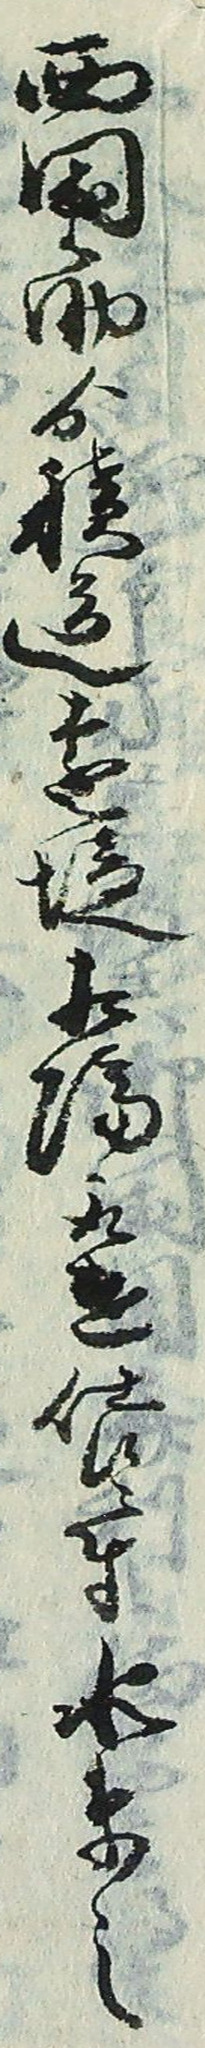西国筋ゟ積送遠境相隔取遣仕候に付水車之
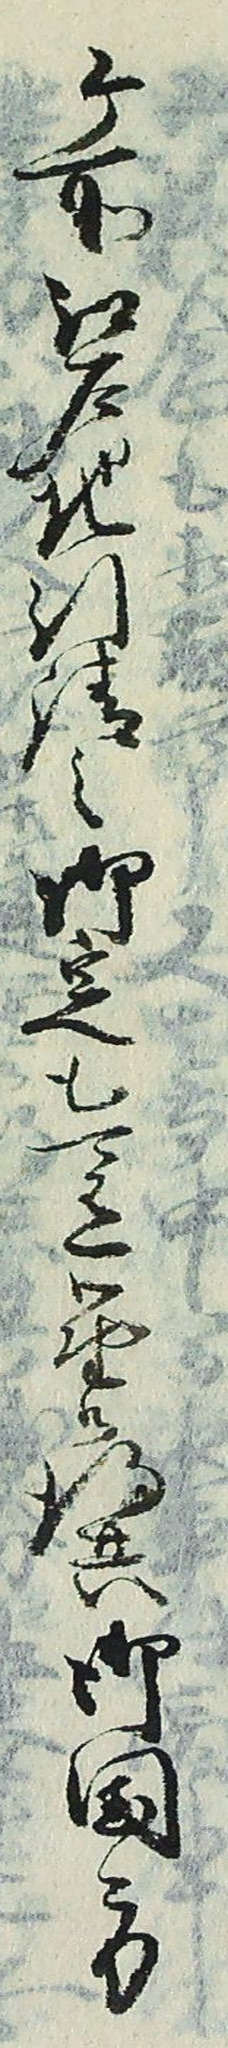ケ所江戸地引請之御定も可有御坐候得共御国方
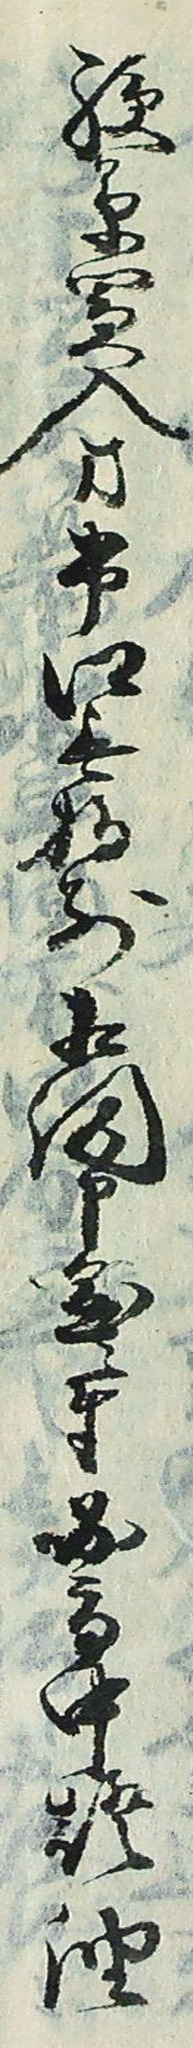絞草買入方市郷無指別相伺申懸に付亦市中燈油
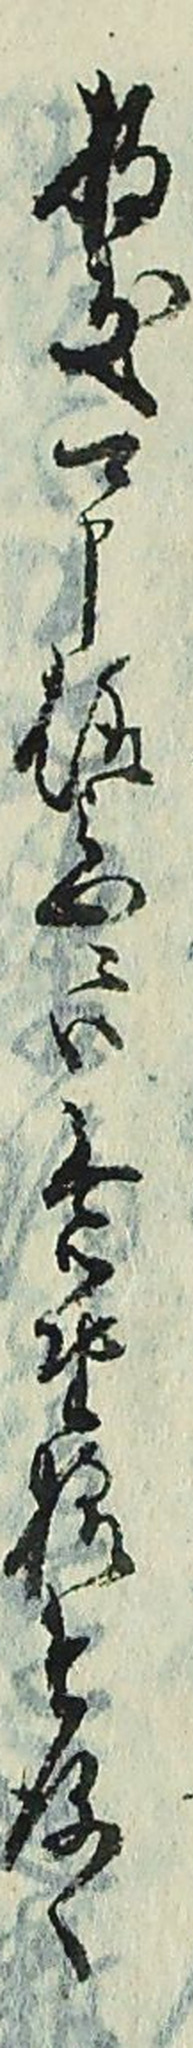指支可申趣意には無御坐様奉存候
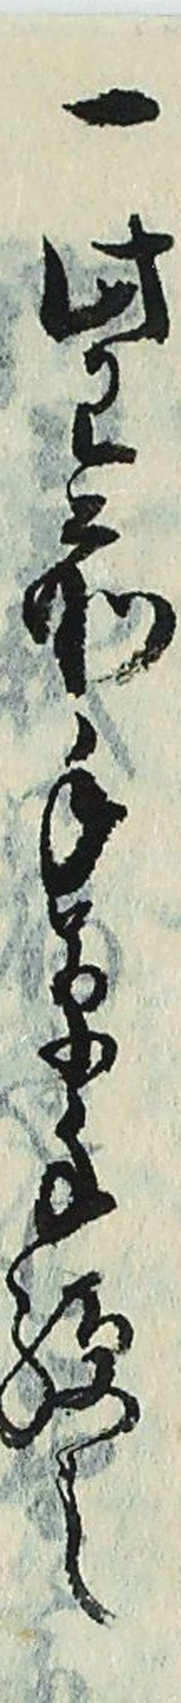一此已前手草手絞之
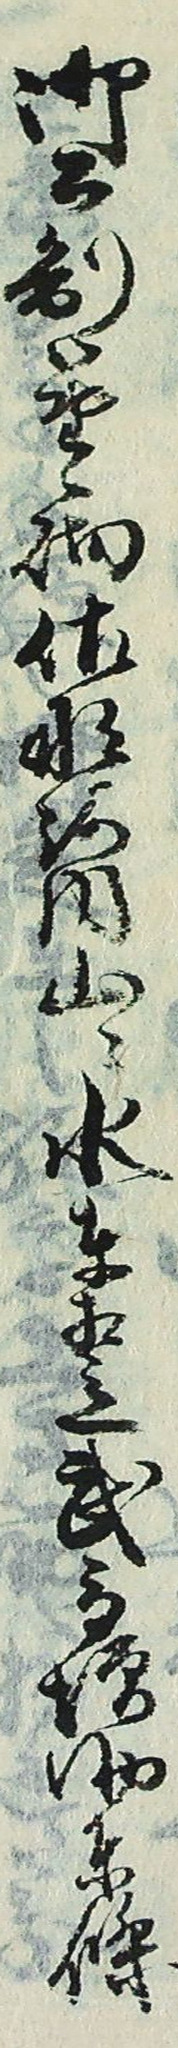御公制御坐候砌佐那河内山々水車相立武市増助東條
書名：油稼御取究ニ附御箇條書テ以被仰渡南北同役申談御答書控
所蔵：鳴門教育大学 Naruto University of Education
